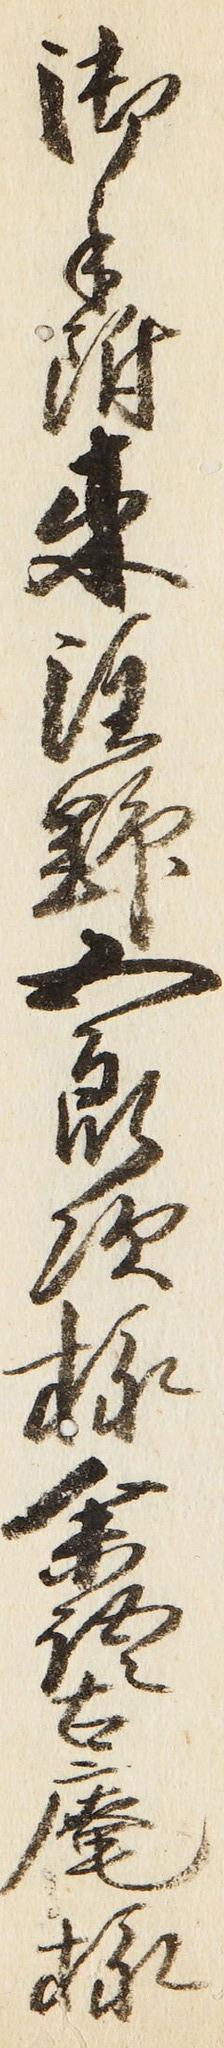御手付来住野五郎次様余語古庵様
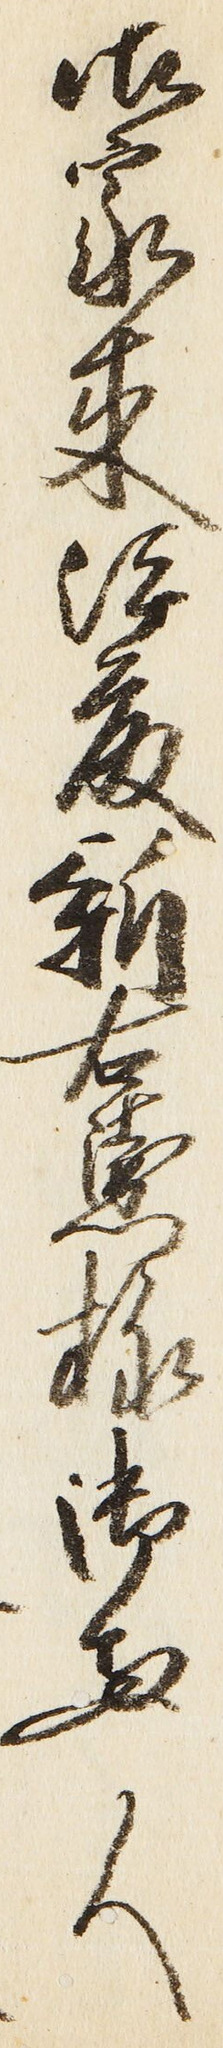御家来伊藤新右衛門様御両人
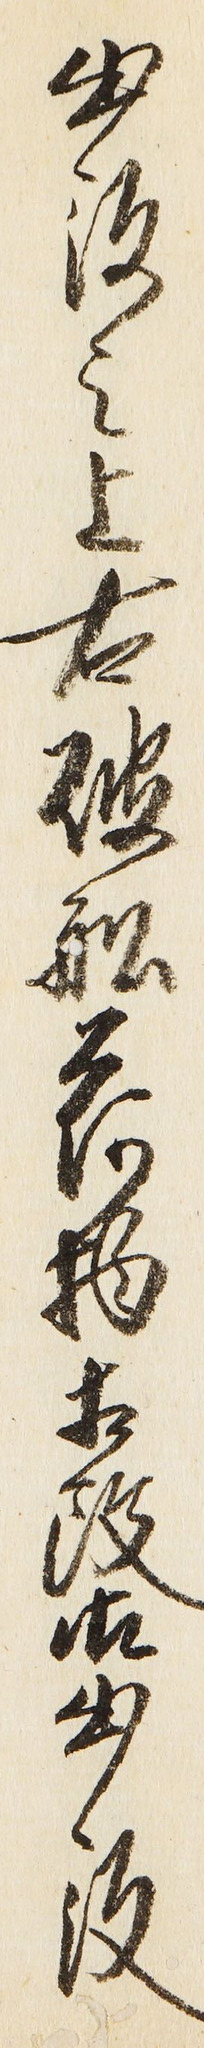出役之上右破船荷物相改御出役
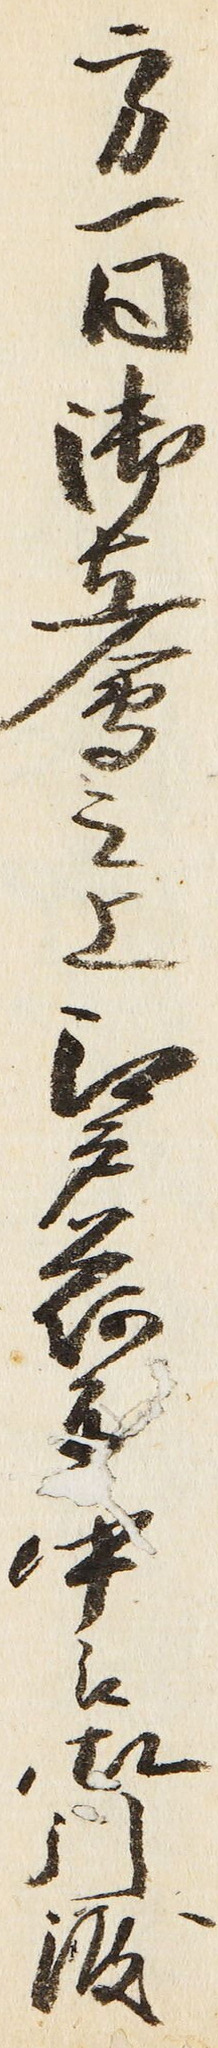方一同御立合之上江戸荷中江御引渡
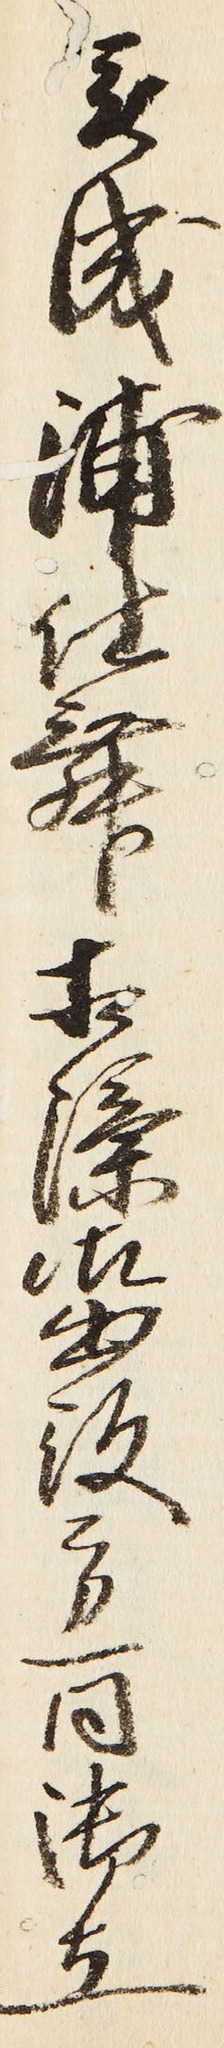被成浦仕舞相済御出役方一同御立
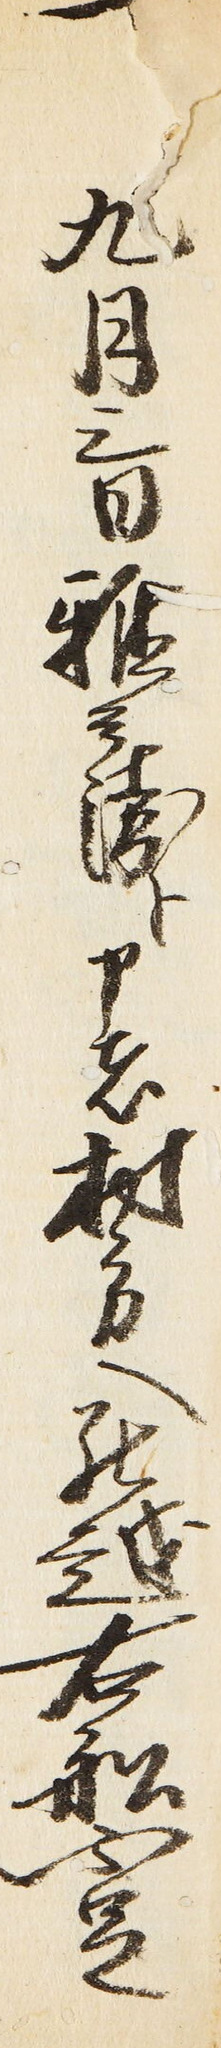一九月三日雅兵衛ト申者村方へ罷越右船不足
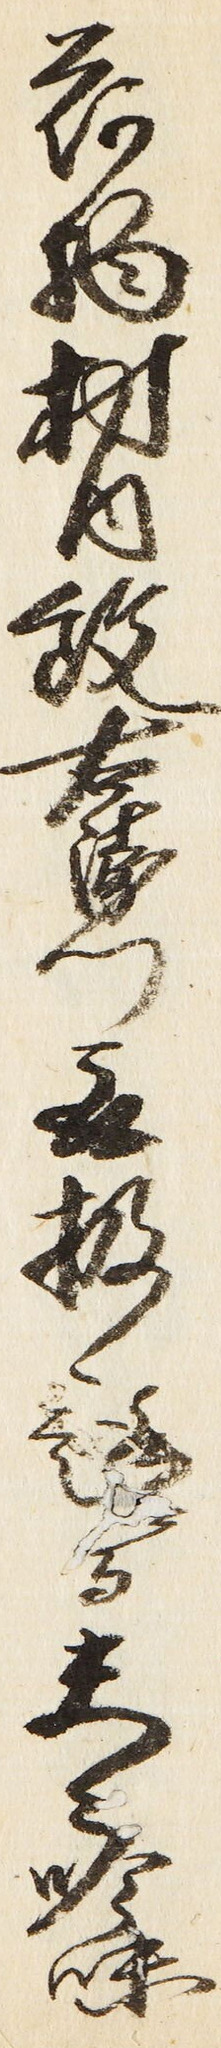荷物村内政右衛門取扱候趣ニ而夫々吟味
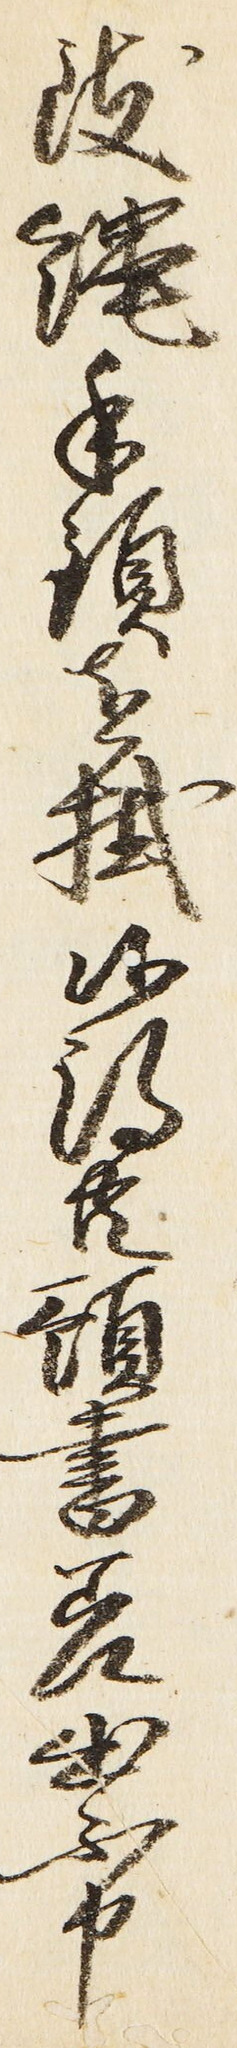致縄手鎖を掛候得共預書差出不申
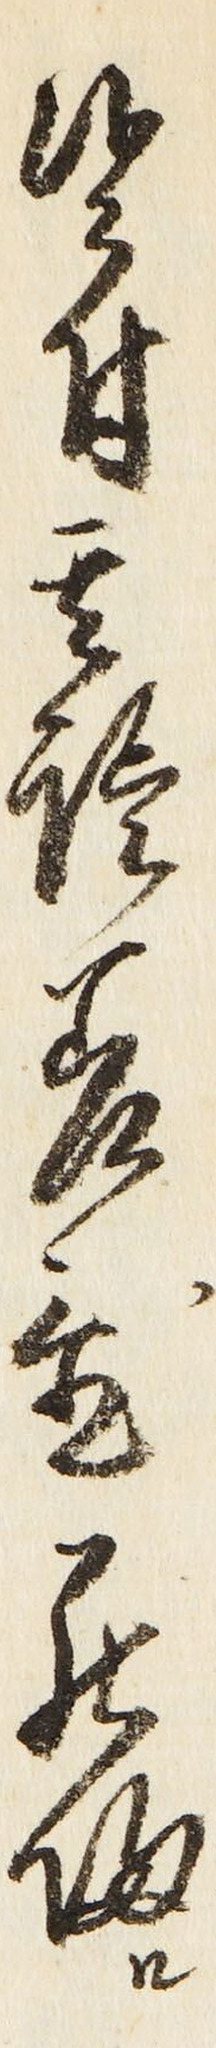候ニ付其儘差置罷帰ル
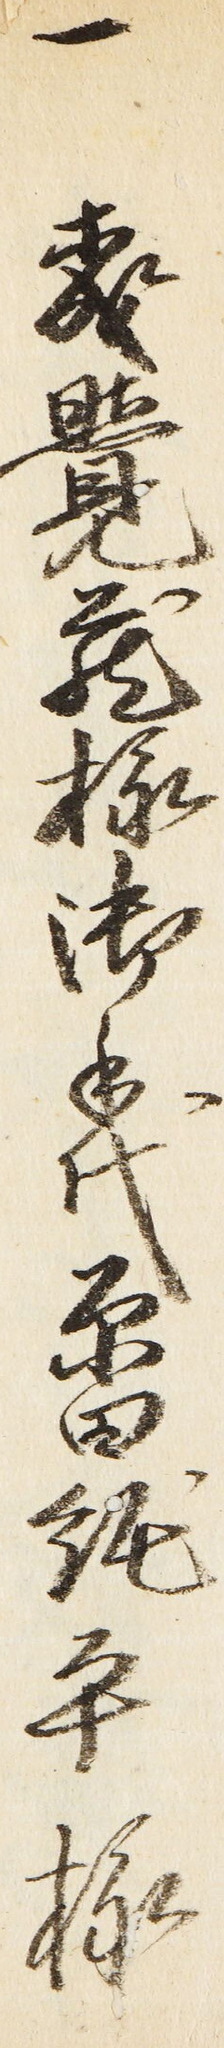一森覚蔵様御手代原田純平様
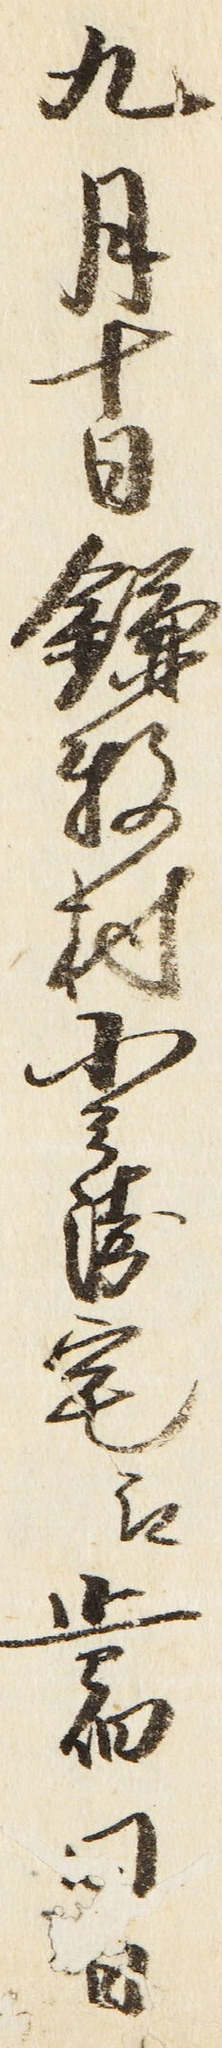九月十日鎌数村小兵衛宅江止宿同日
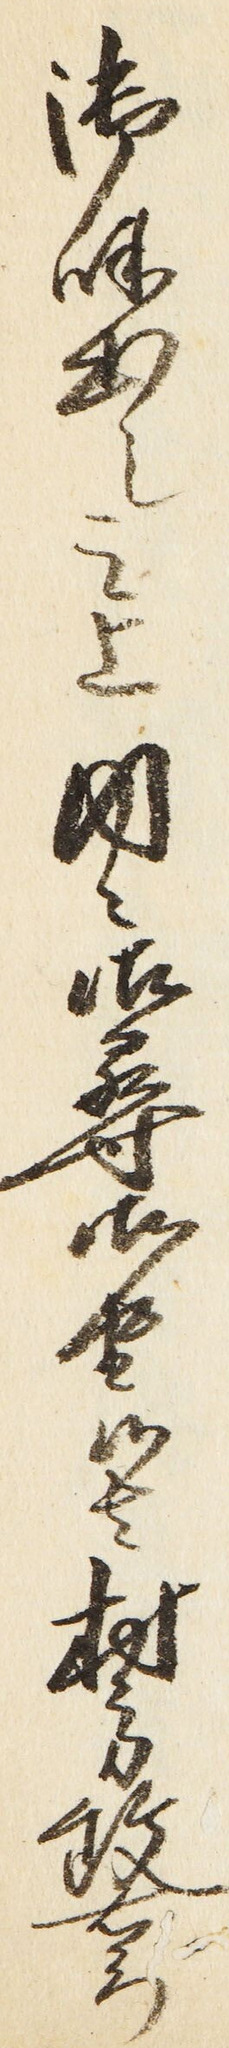御呼出し之上内々御尋御座候者村方政右衛門

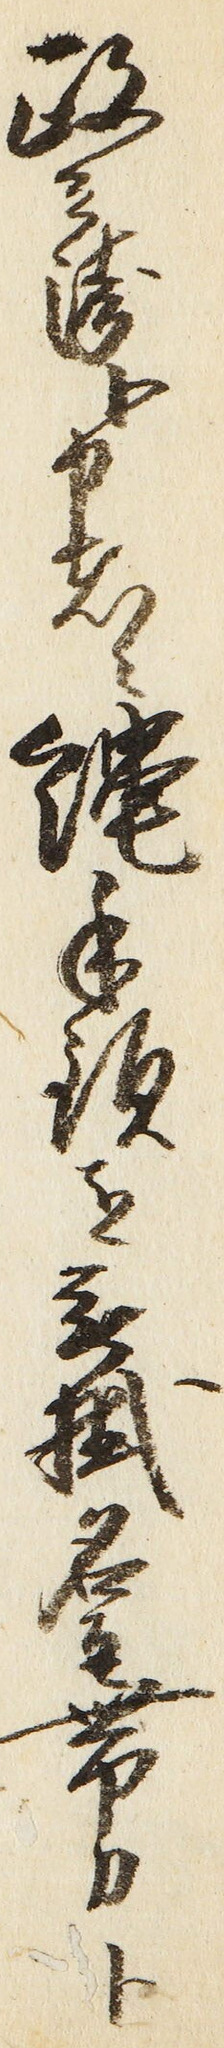政兵衛ト申者ニ縄手鎖を被掛名主帯刀ト
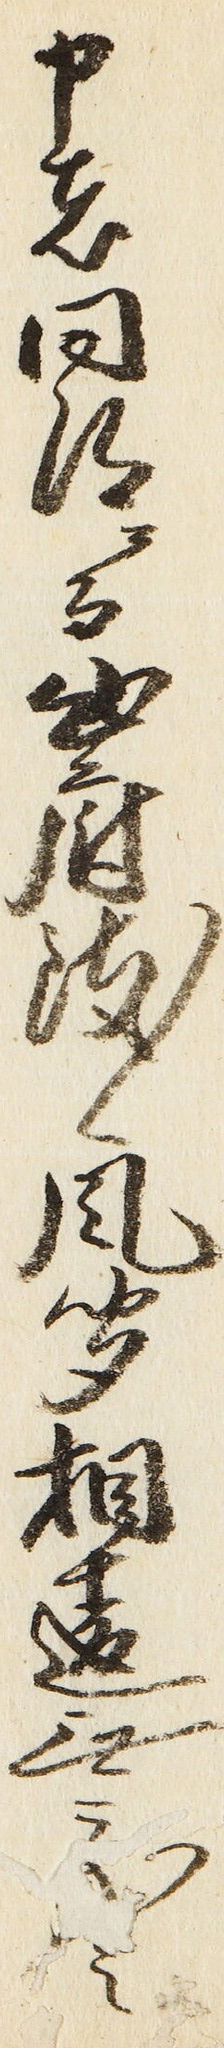申者同道ニ而出府致候風聞相違無之哉之
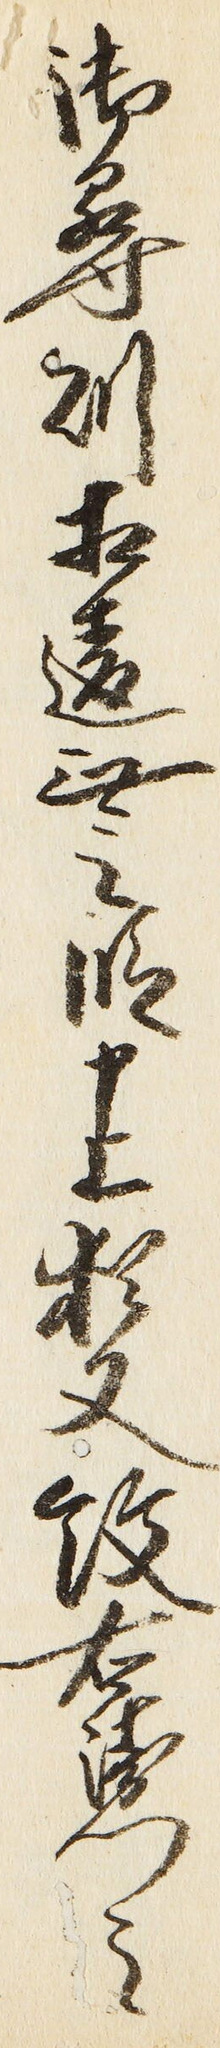御尋則相違無之段申上猶又政右衛門之
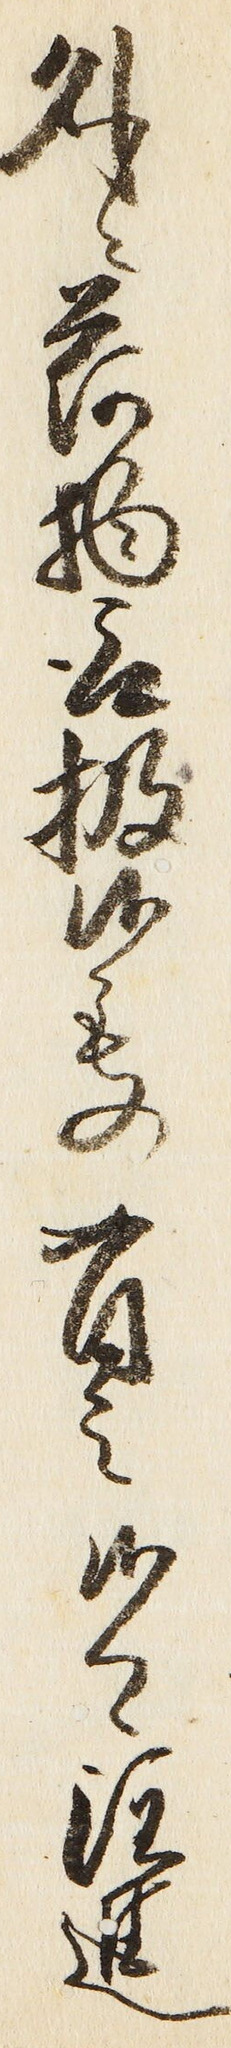外ニ荷物取扱候もの有之候ハヽ注進
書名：難船一件記録
